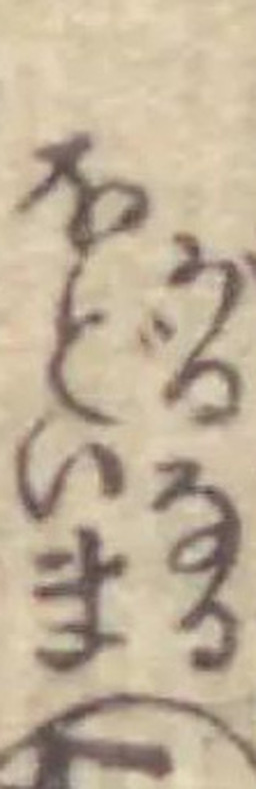ほどいま
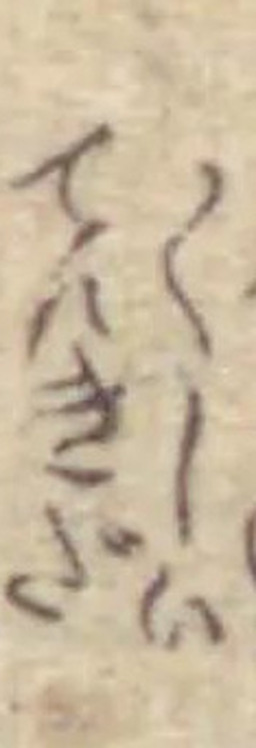てんきだ
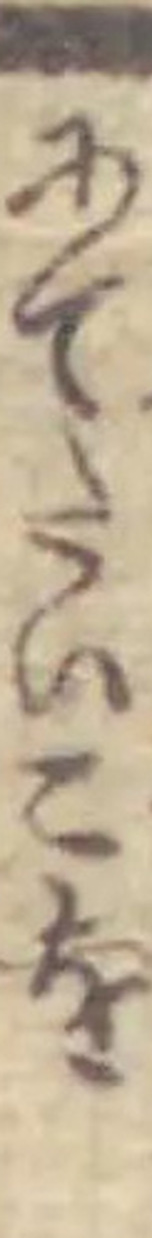にてたいこを
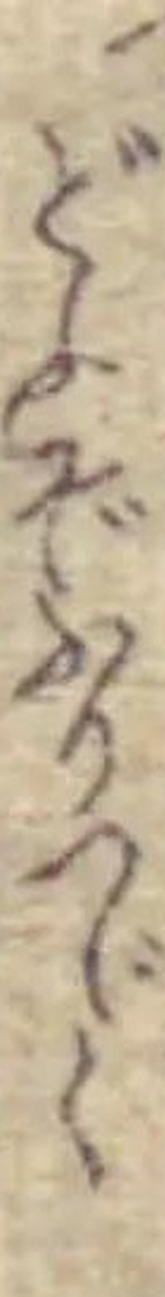〽どふぞふりつゞく
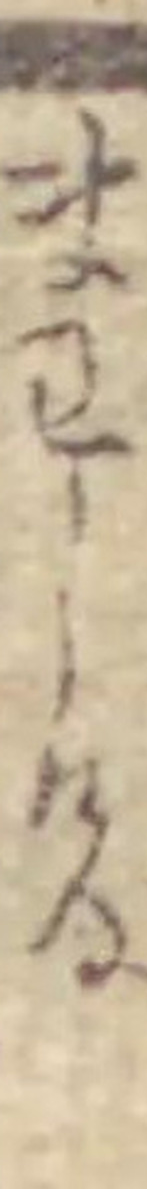まわしける
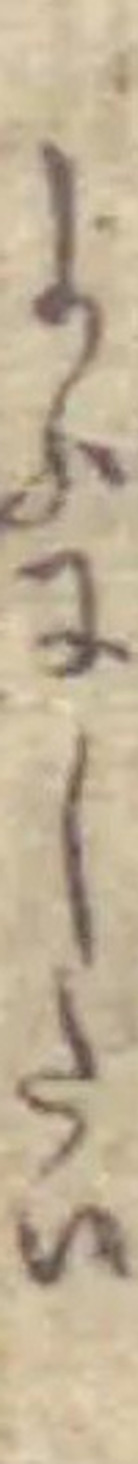よふにしたい
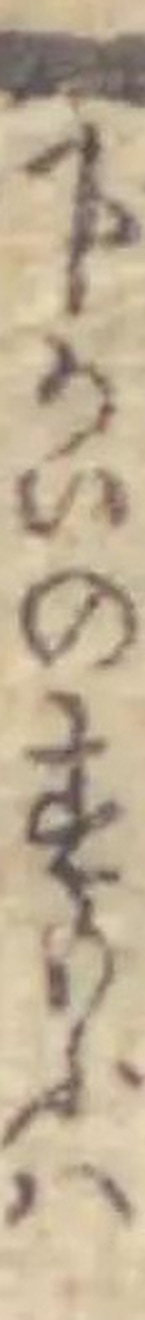下かいのすもふは
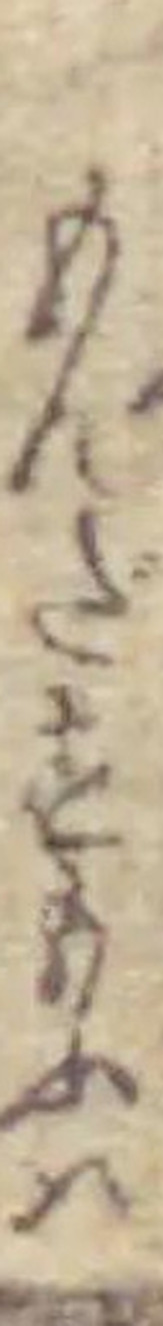もんだすもふは
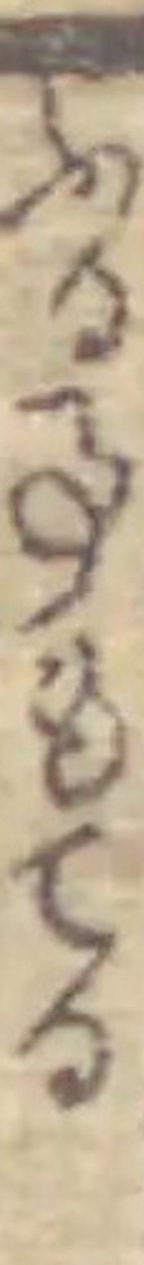ふる事もてる
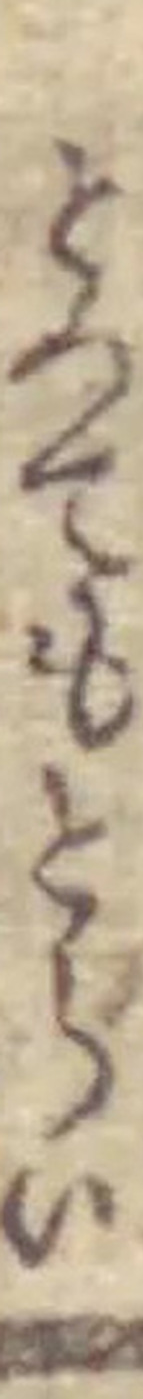とつてもとらい
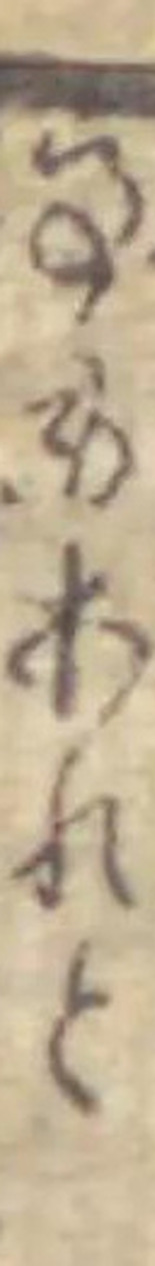事もあれと
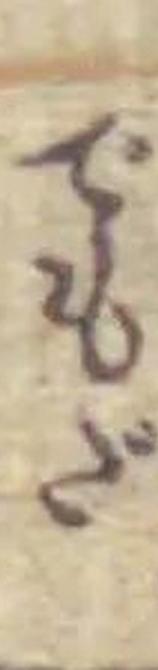でもだ
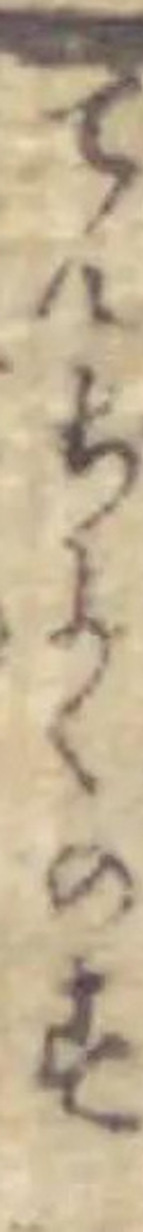てんぢよくのす
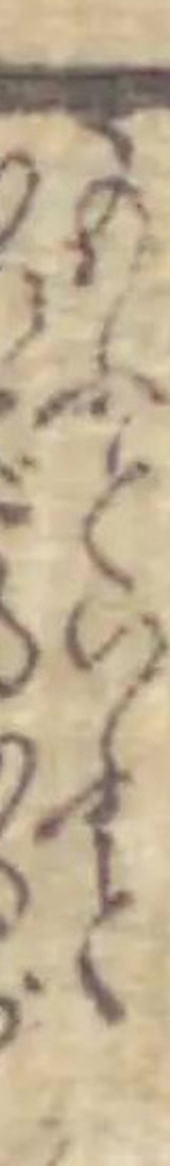もふといふと
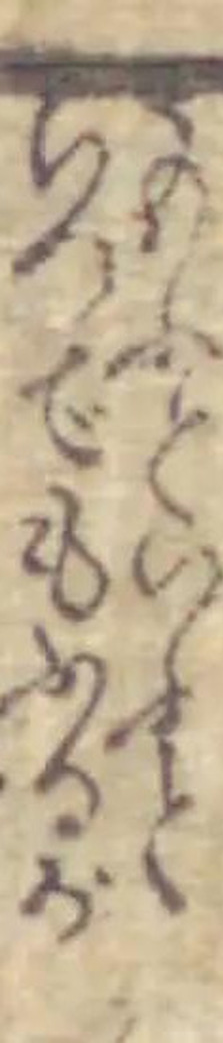いつでもふるが
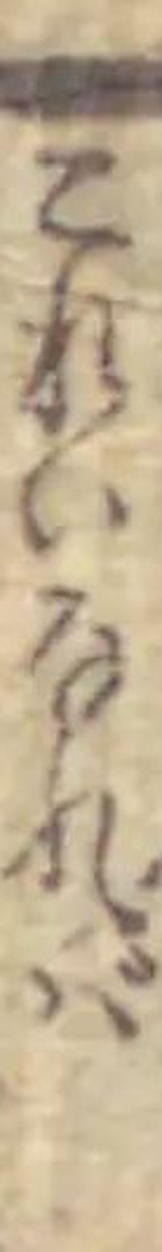これいなれば
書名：雨宮風宮出儘略縁記 3巻
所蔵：国立国会図書館 National Diet Library, JAPAN
